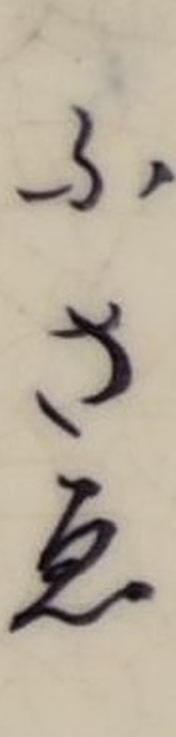ふさえ
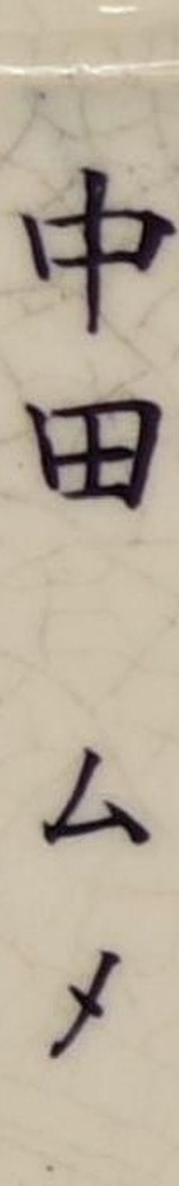中田ムメ
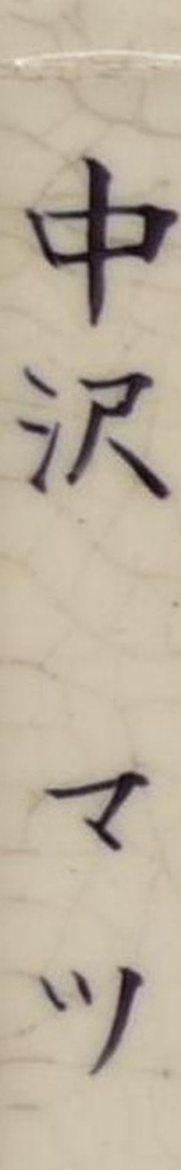中沢マツ

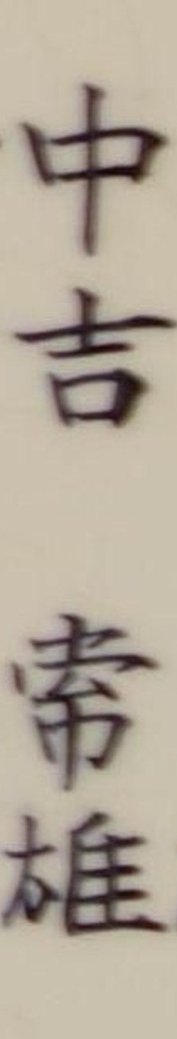中吉常雄
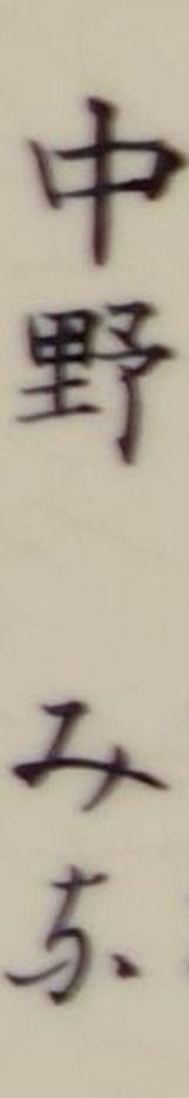中野みな
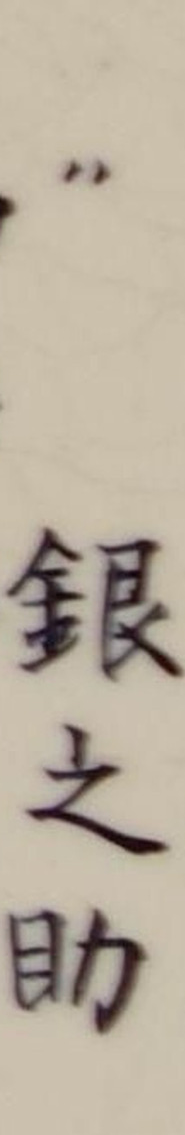銀之助
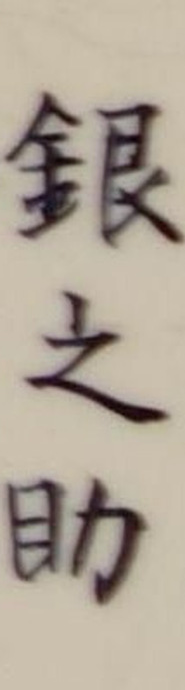銀之助
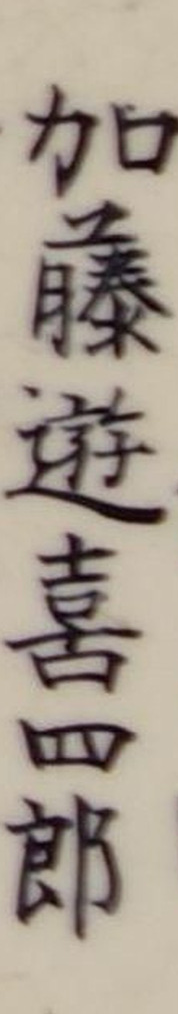加藤遊喜四郎
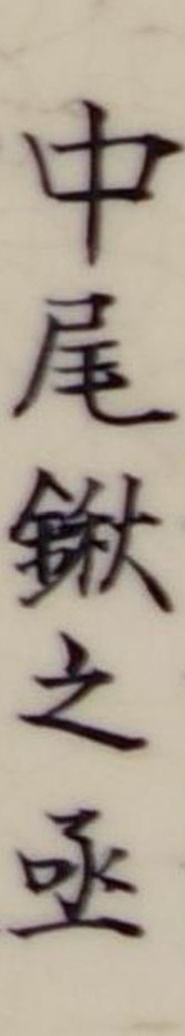中尾鍬之丞
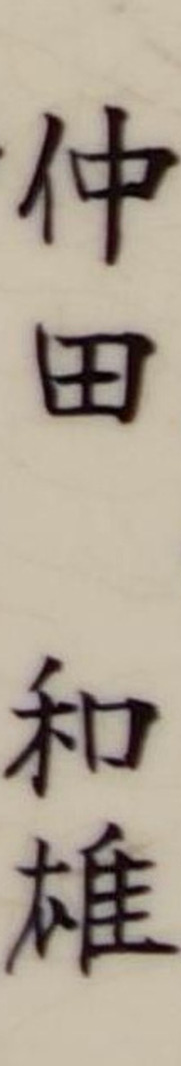仲田和雄
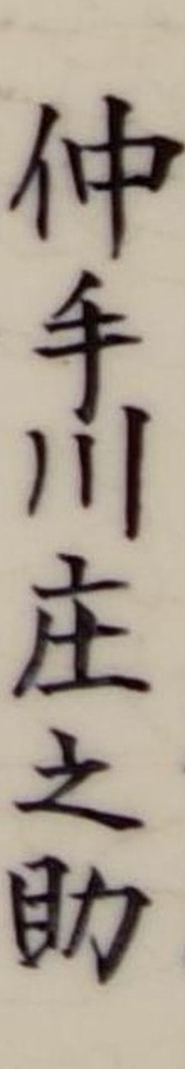仲手川庄之助
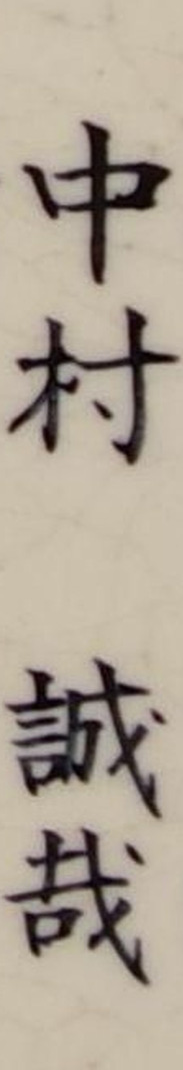中村誠哉
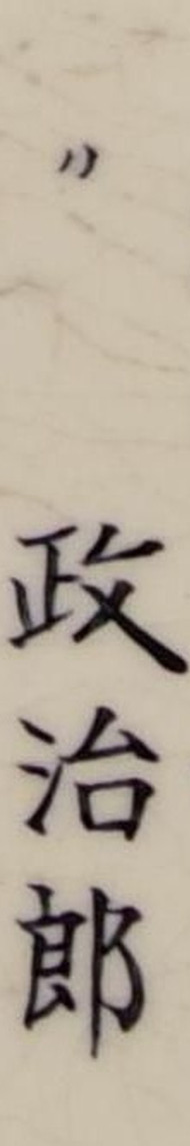政治郎
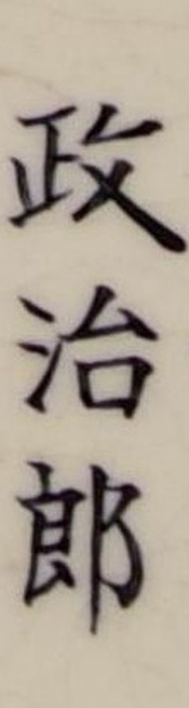政治郎
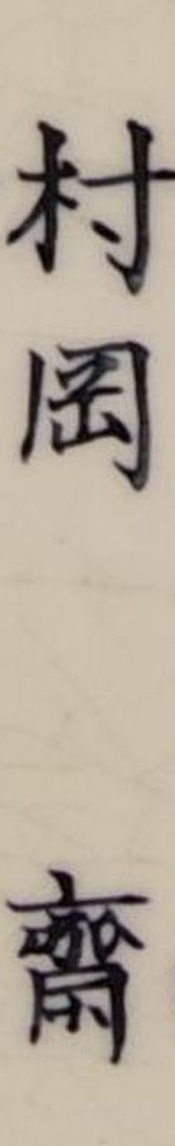村岡齋
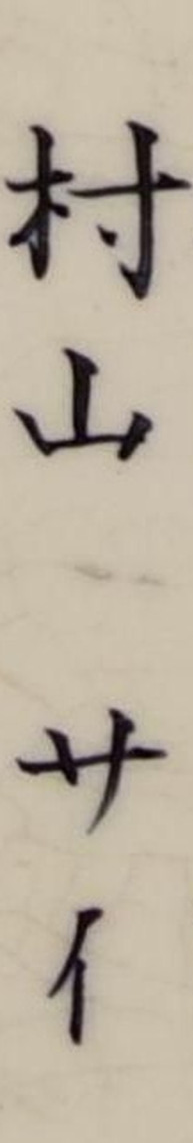村山サイ
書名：M~S
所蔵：高野山金剛峯寺
